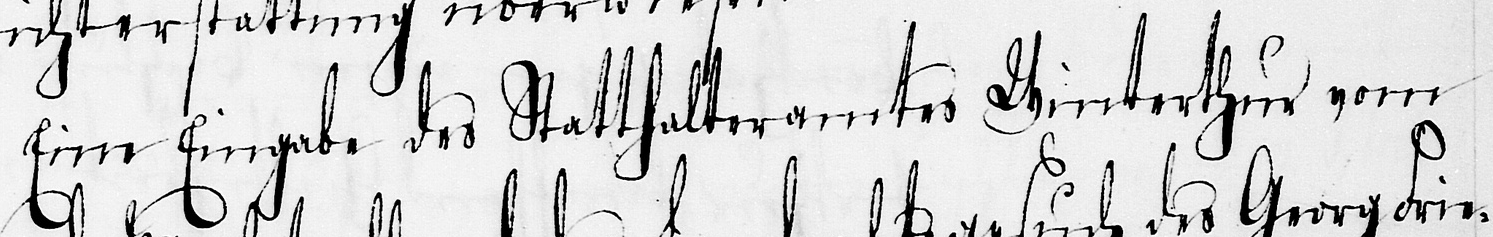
Eine Eingabe des Statthalteramtes Winterthur vom
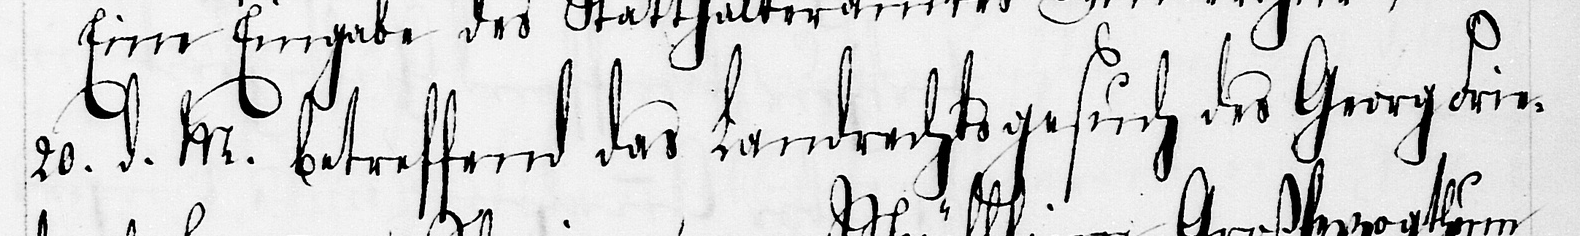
d. M. betreffend das Landrechtsgesuch des Georg Fri¬
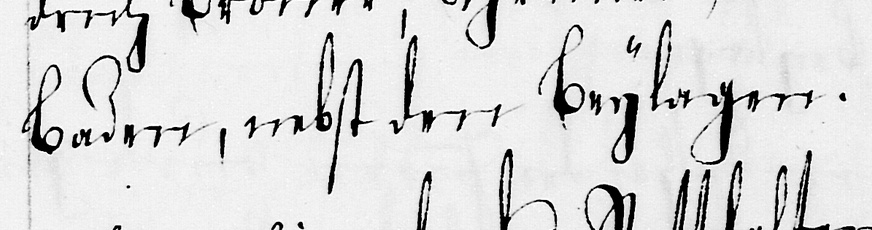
Baden, nebst den Beylagen.
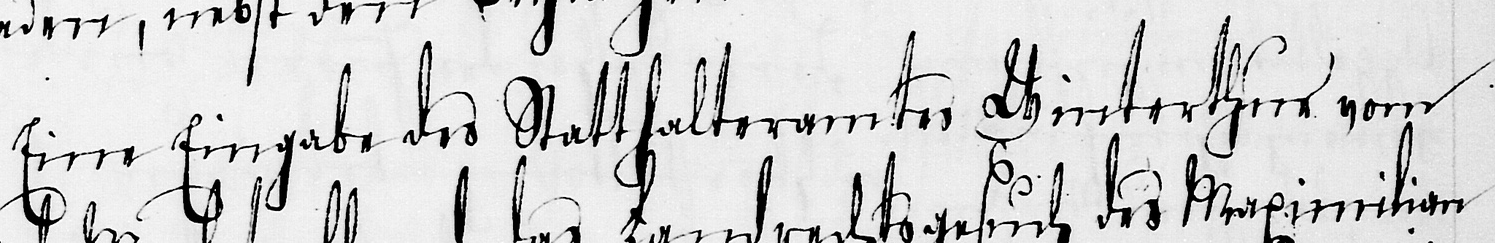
Eine Eingabe des Statthalteramtes Winterthur vom
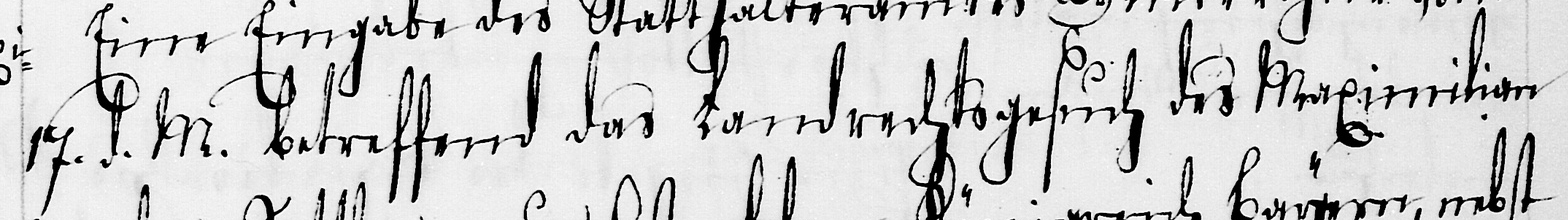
17. d. M. betreffend das Landrechtsgesuch des Maximilian
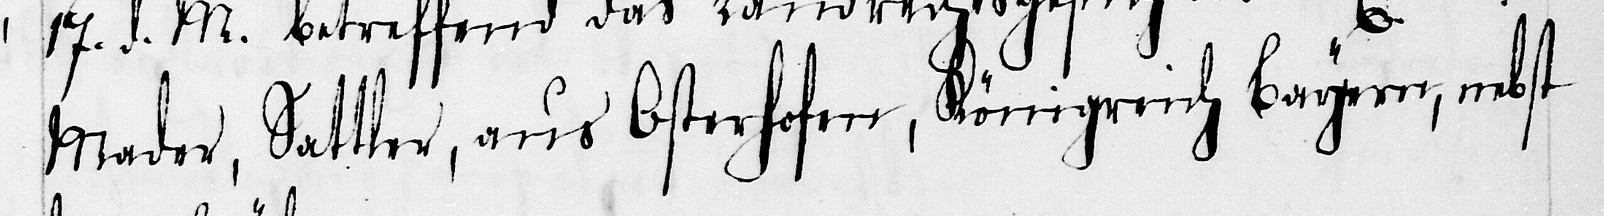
Mader, Sattler, aus Osterhofen, Königreich Bayern, nebst
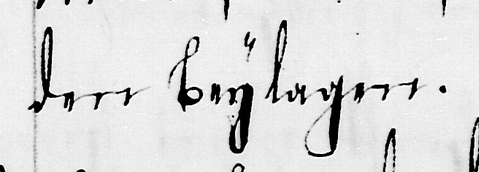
den Beylagen.
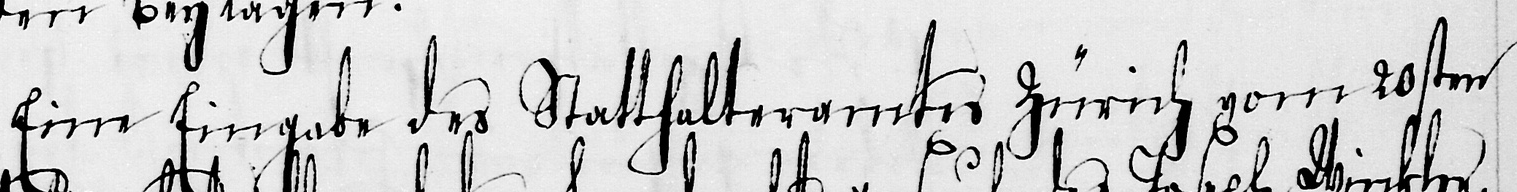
Eine Eingabe des Statthalteramtes Zürich vom 20sten
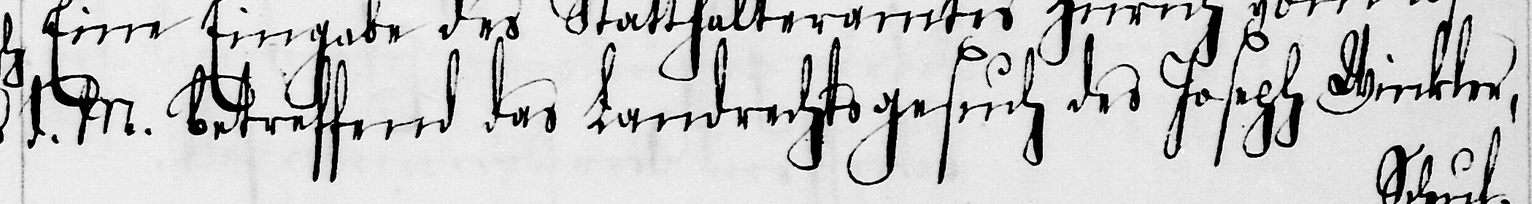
d. M. betreffend das Landrechtsgesuch des Joseph Winkler,
